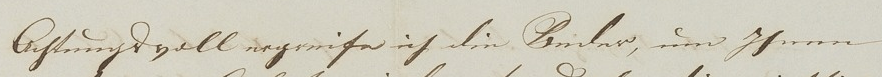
Achtungsvoll ergreife ich die Feder, um Ihnen
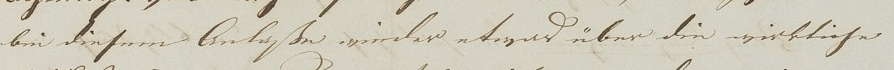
bei diesem Anlaße wieder etwas über die wirkliche
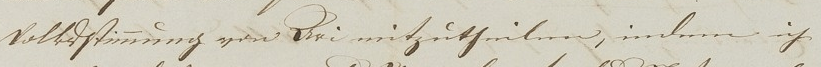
Volksstimmung von Uri mitzutheilen, indem ich
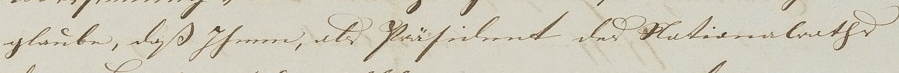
glaube, daß Ihnen, als Präsident des Nationalraths
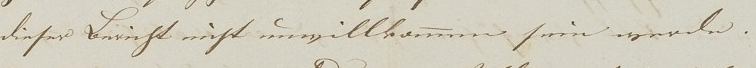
dieser Bericht nicht unwillkommen sein werde. –
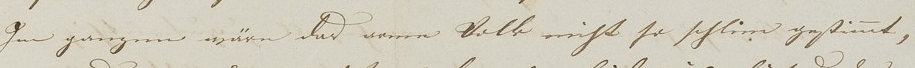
Im ganzen wäre das arme Volk nicht so schlim gestimmt,
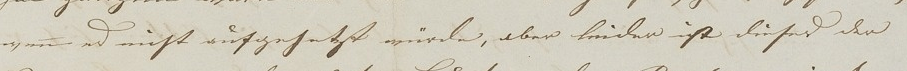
wenn es nicht aufgehetzt würde, aber leider ist dieses der
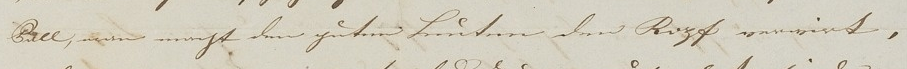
Fall, man macht den guten Leuten den Kopf verwirt,
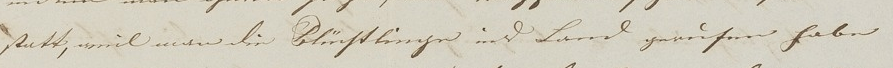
statt, weil man die Flüchtlinge ins Land gerufen habe
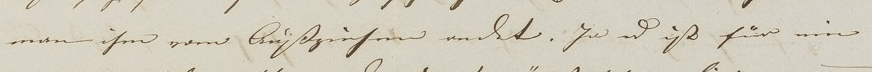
man ihm vom Außziehen redet. Ja, es ist für ein
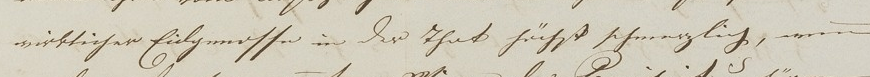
wirklicher Eidgenosse in der That höchst schmerzlich, wenn
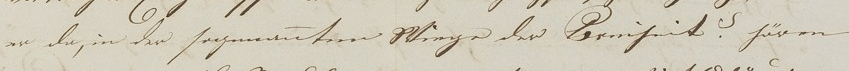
er da, in der sogenannten Wiege der Freiheit? hören
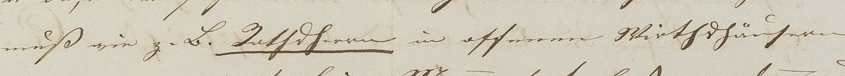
muß wie z. B. Rathsherrn in offenen Wirthshäusern
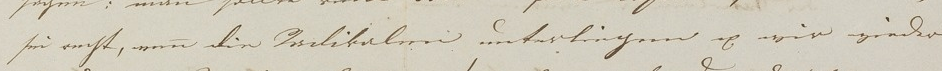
sei recht, wenn die Radikalen unterliegen & wir wieder
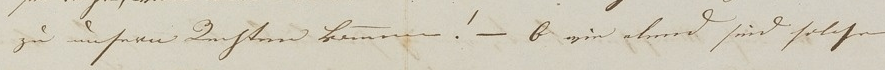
zu unseren Rechten kommen! – O wie elend sind solche
